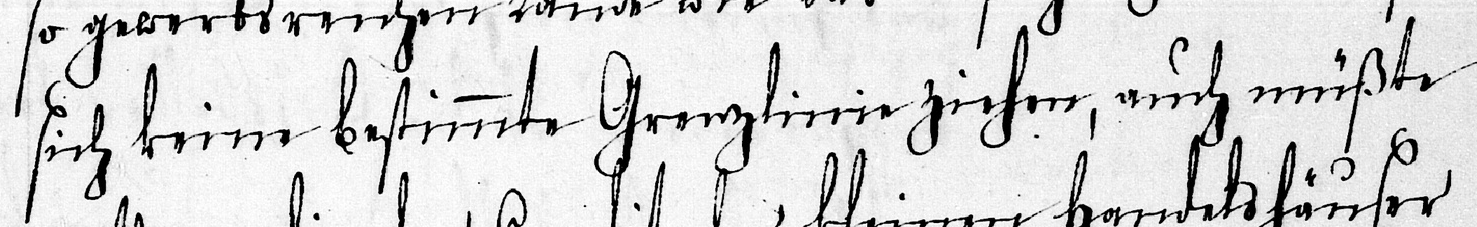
sich keine bestimmte Grenzlinie ziehen, auch müßte
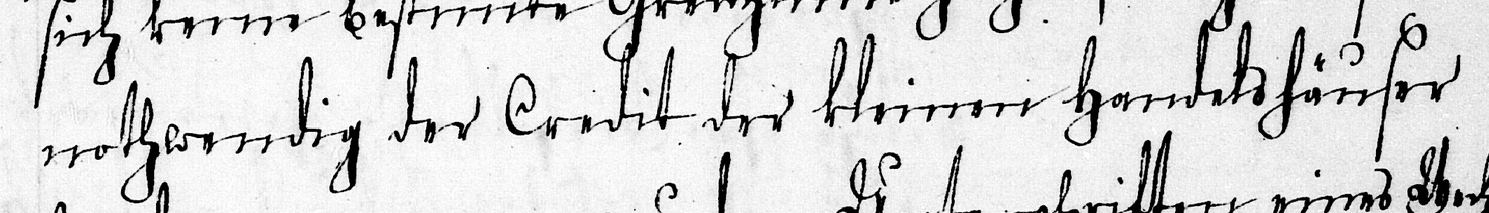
nothwendig der Credit der kleinen Handelshäuser
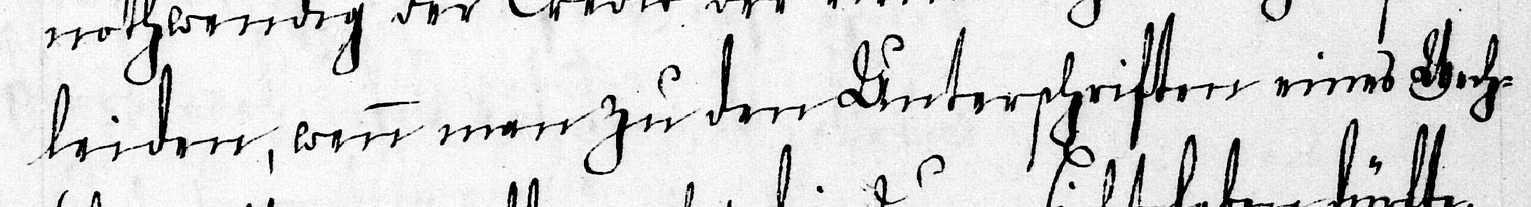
leiden, wenn man zu den Unterschriften eines Wech¬
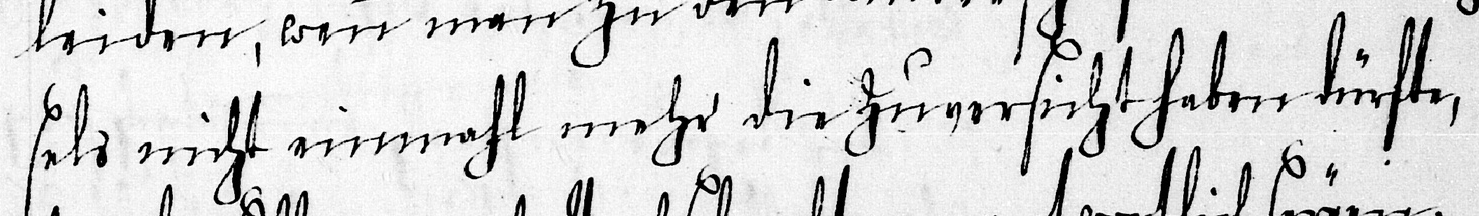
sels nicht einmahl mehr die Zuversicht haben dürfte,
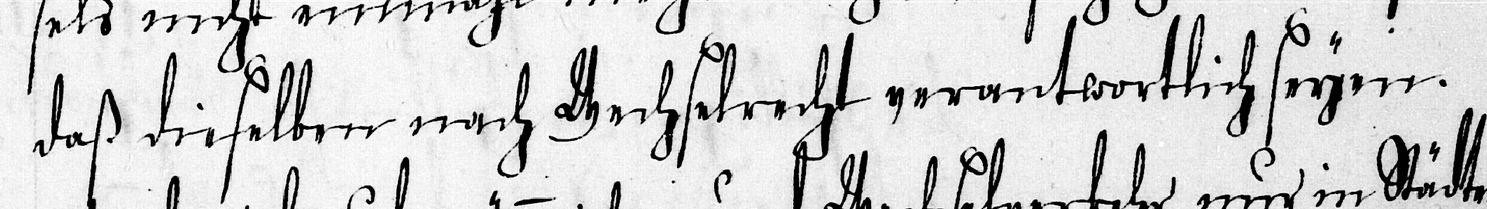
daß dieselben nach Wechselrecht verantwortlich seyen.
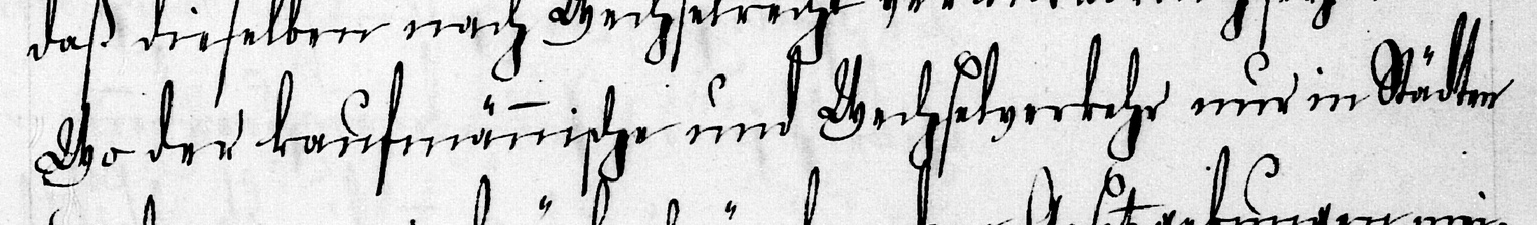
Wo der Kaufmännische und Wechselverkehr nur in Städten
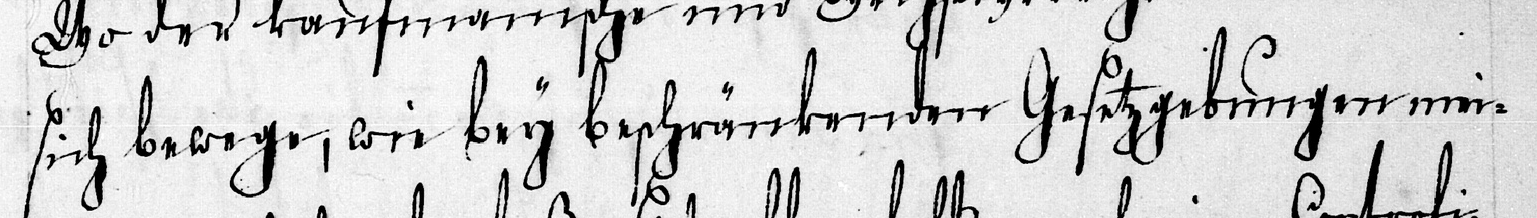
sich bewege, wie bey beschränkenden Gesetzgebungen mei¬
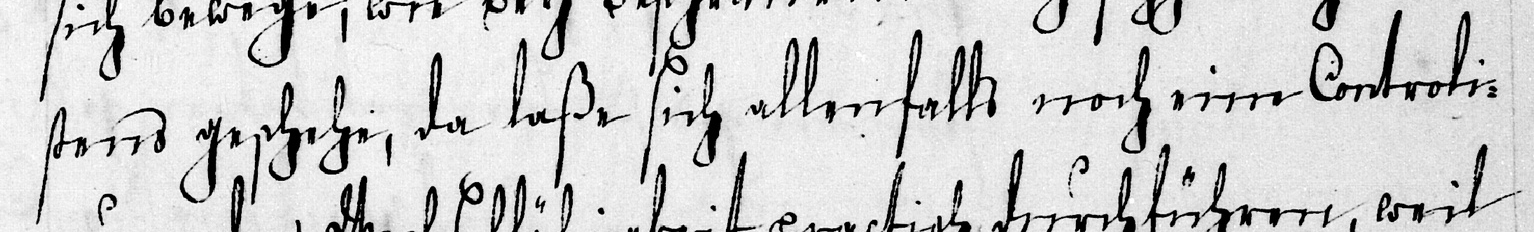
stens geschehe, da laße sich allenfalls noch eine Controli¬
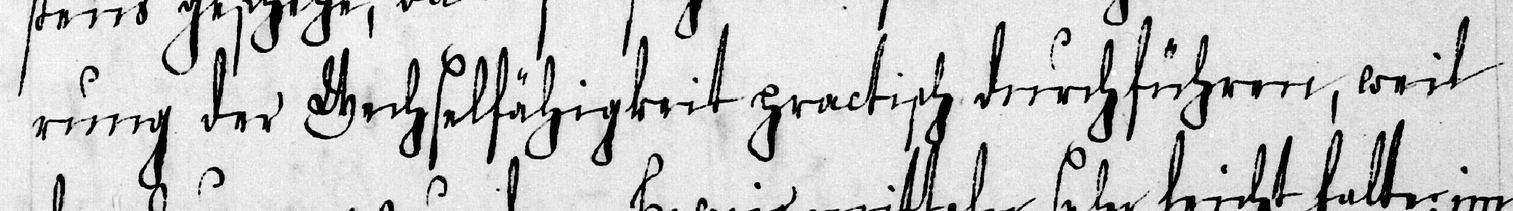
rung der Wechselfähigkeit practisch durchführen, weil
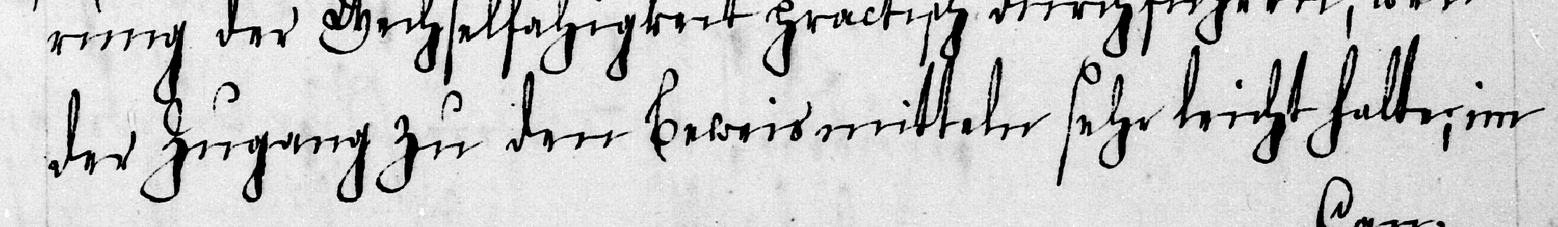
der Zugang zu den Beweismitteln sehr leicht halte, im
